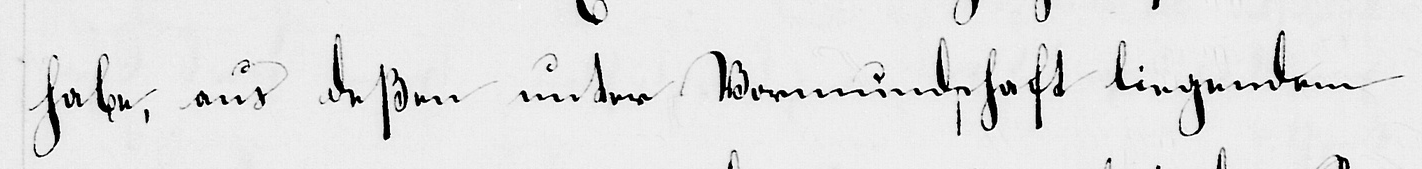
habe, aus deßen unter Vormundschaft liegenden
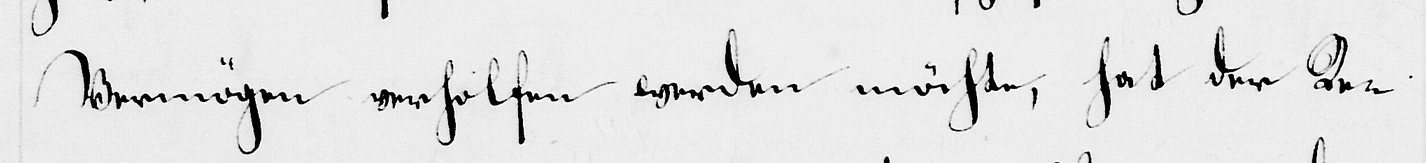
Vermögen verholfen werden möchte, hat der Re¬
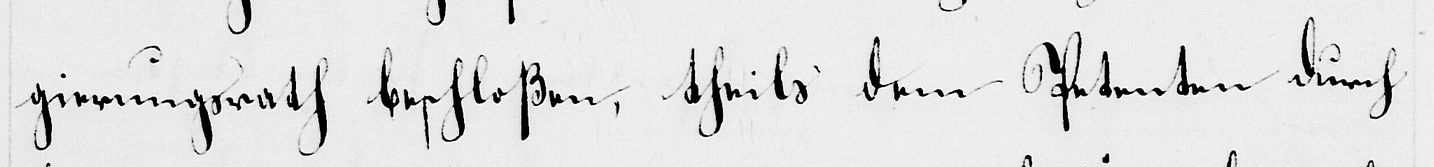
gierungsrath beschloßen, theils dem Petenten durch
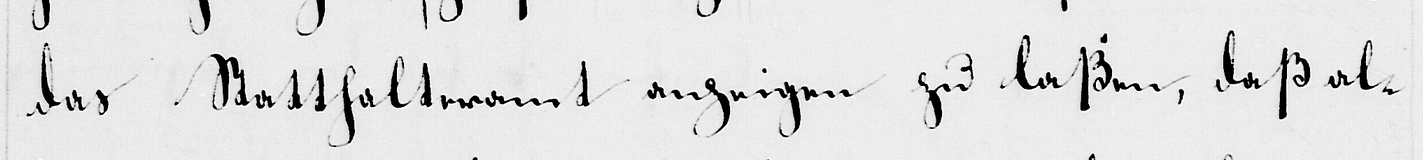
das Statthalteramt anzeigen zu laßen, daß al¬
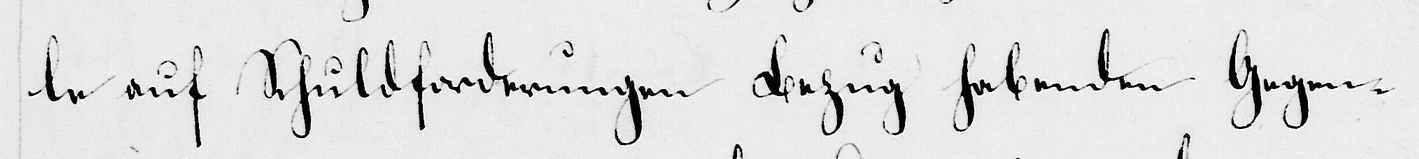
le auf Schuldforderungen Bezug habenden Gegen¬
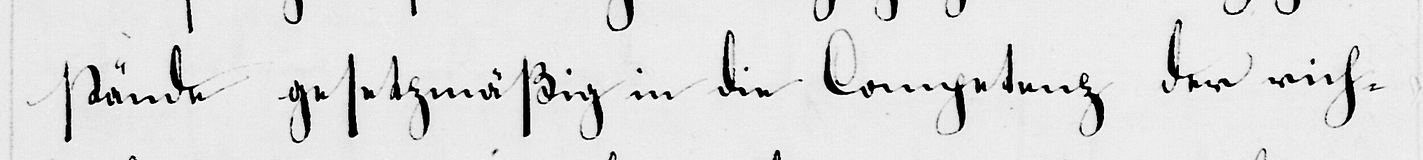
stände gesetzmäßig in die Competenz der rich¬
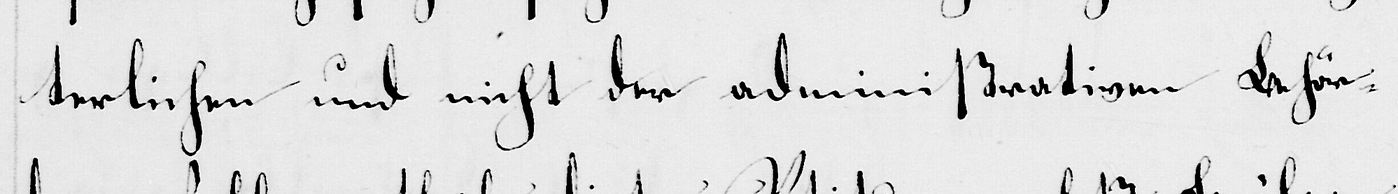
terlichen und nicht der administrativen Behör¬
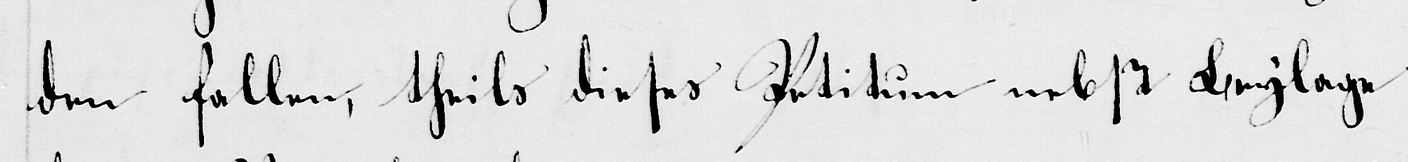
den fallen, theils dieses Petitum nebst Beylage
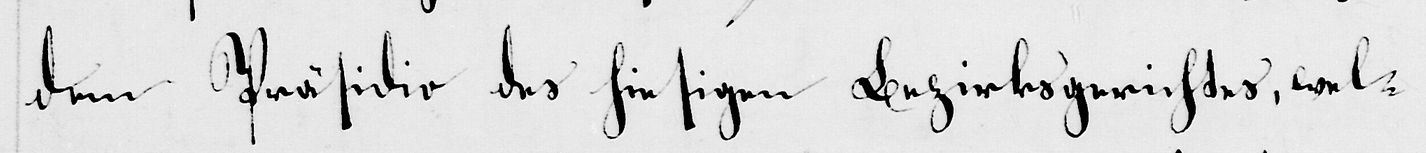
dem Präsidio des hiesigen Bezirksgerichtes, wel¬
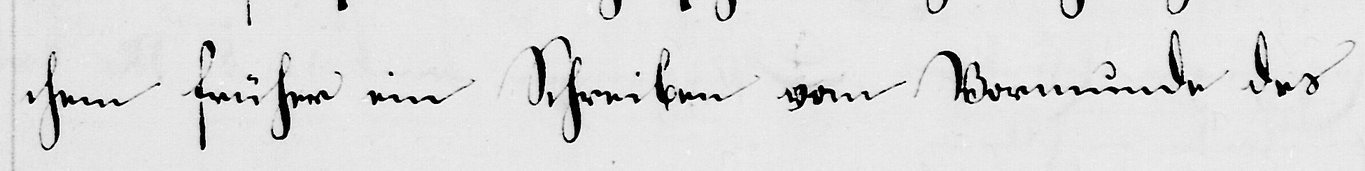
chem früher ein Schreiben vom Vormunde des
